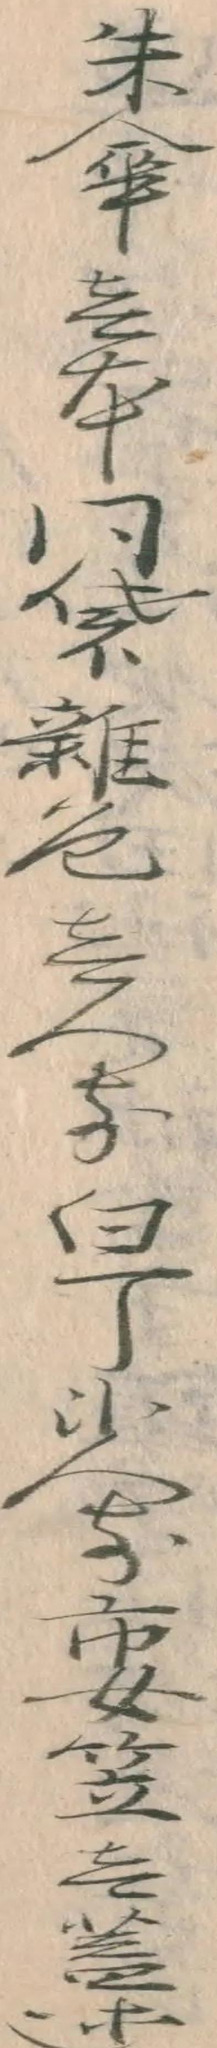朱傘壱本同袋雑色壱人前白丁弐人前市女笠壱蓋等也
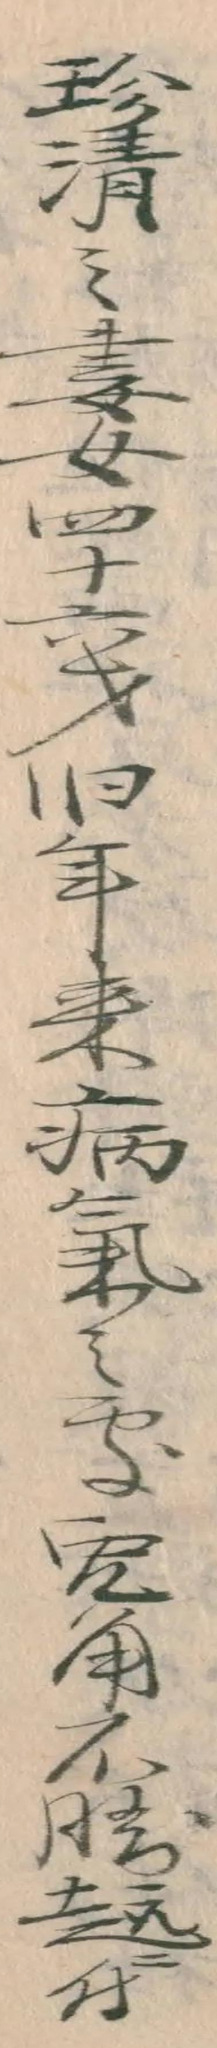一珍清之妻女四十六才旧年来病氣之處兎角不勝趣ニ付
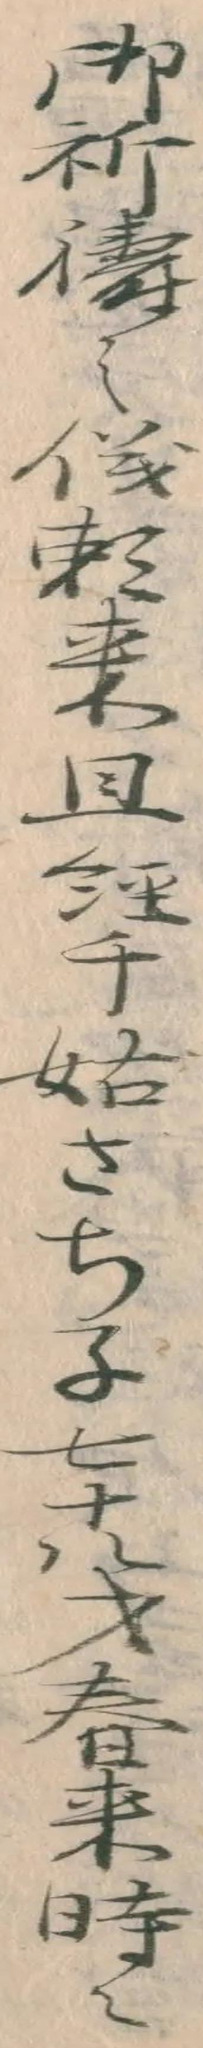御祈祷之儀頼来且経千姑さち子七十八才春来時々
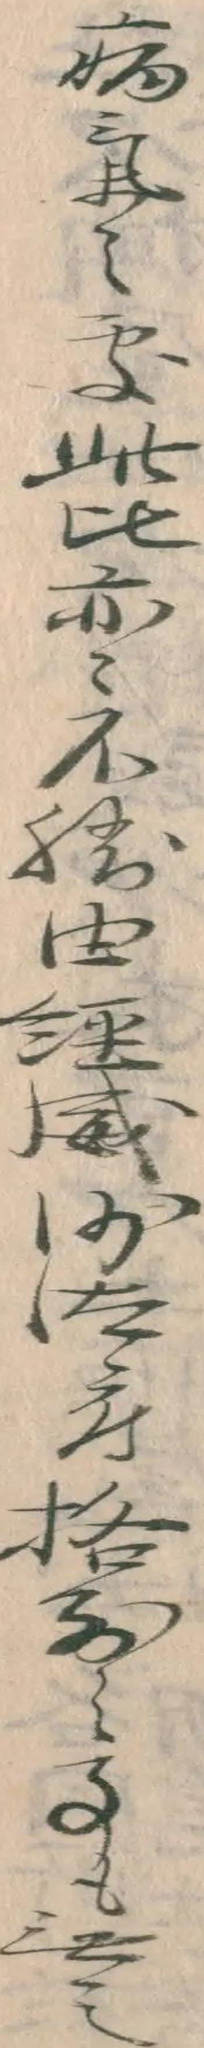病気之處此比亦々不勝由経威沙汰ニ付格別之事も無之
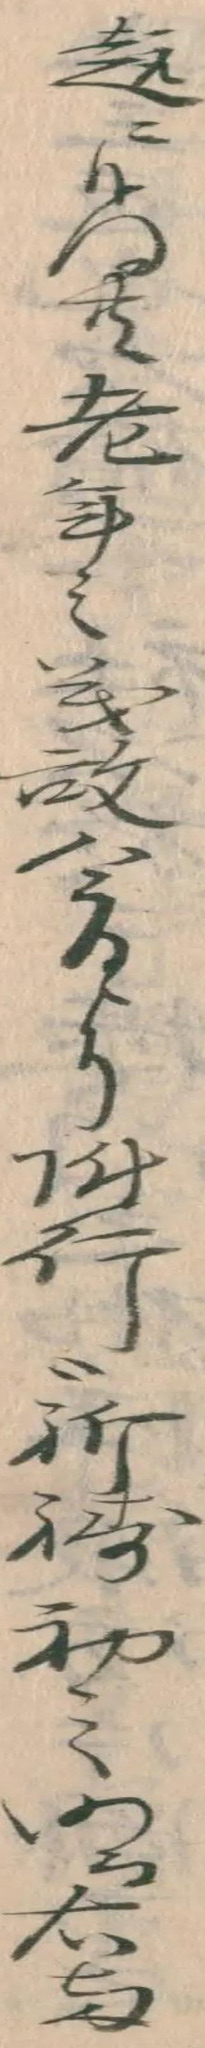趣ニ候得共老年之義故今日より附行御祈祷初之仍而右両
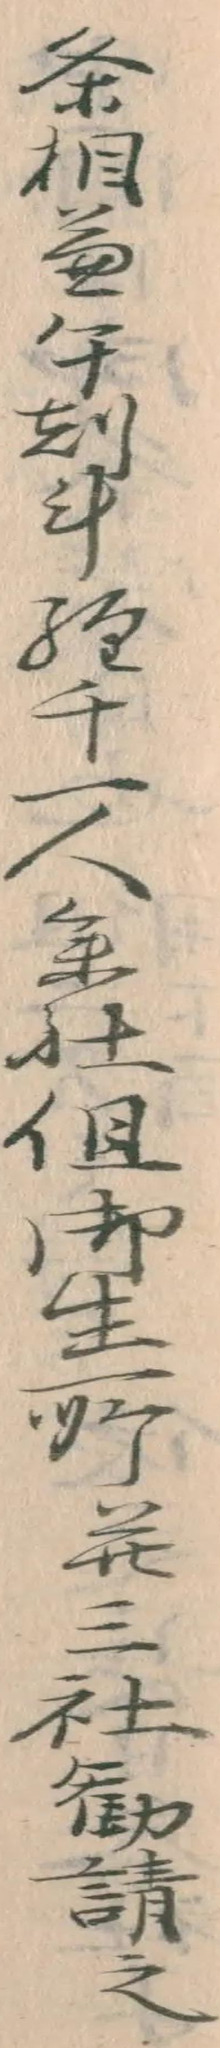条相兼午刻斗経千一人参社但御生所并三社勧請之
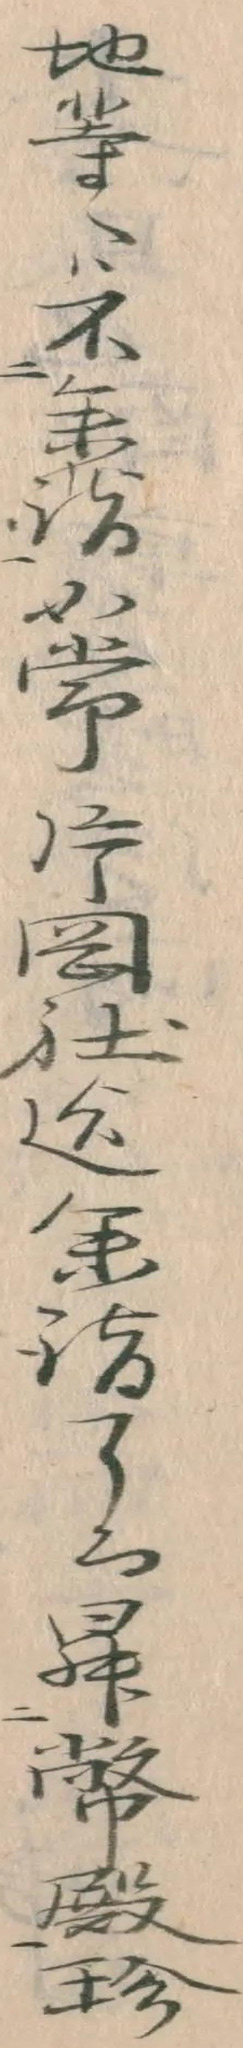地等ヘハ不参詣如常片岡社迄参詣了而昇幣殿珍
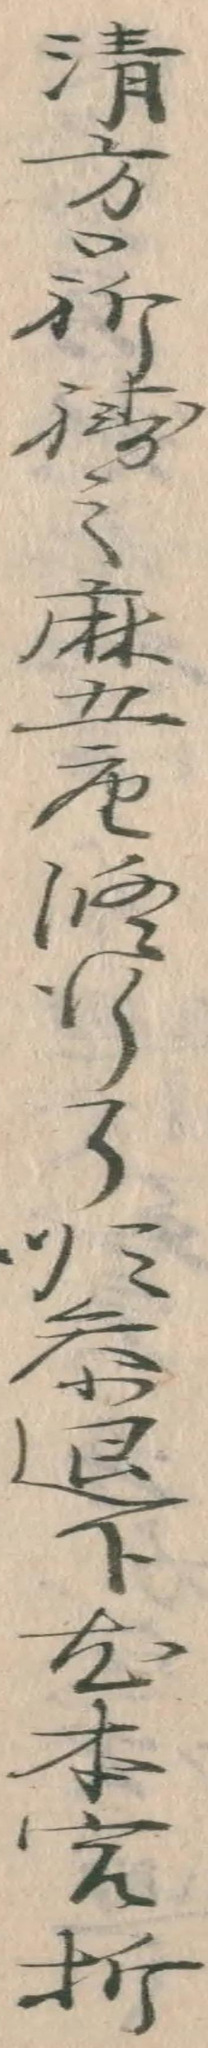清方御祈祷之麻五座修行了順参退下尤本宮折
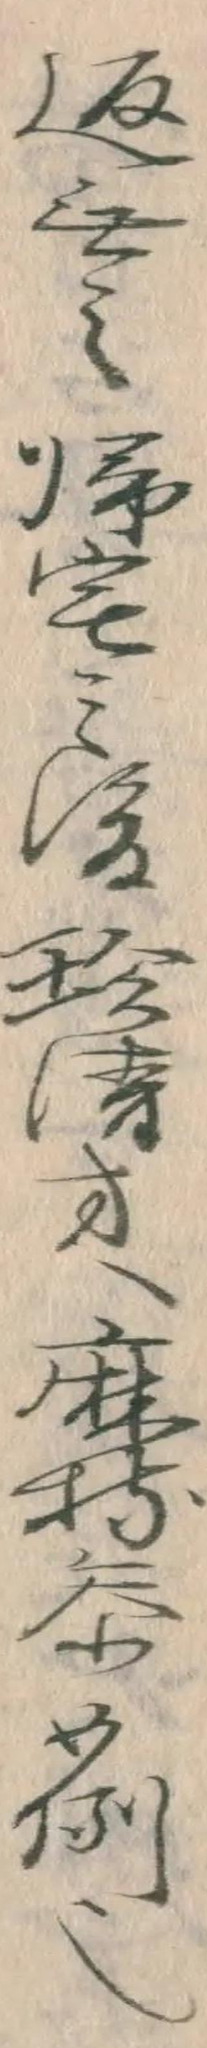返無之帰宅之後珍清方へ麻持参如例也
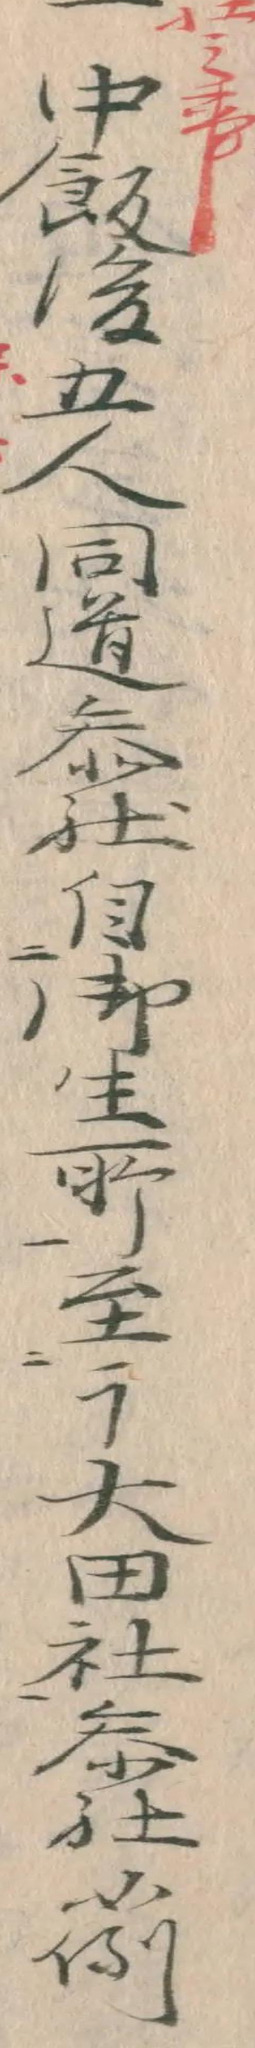一中飯後五人同道参社自生所至于大田社参社以例
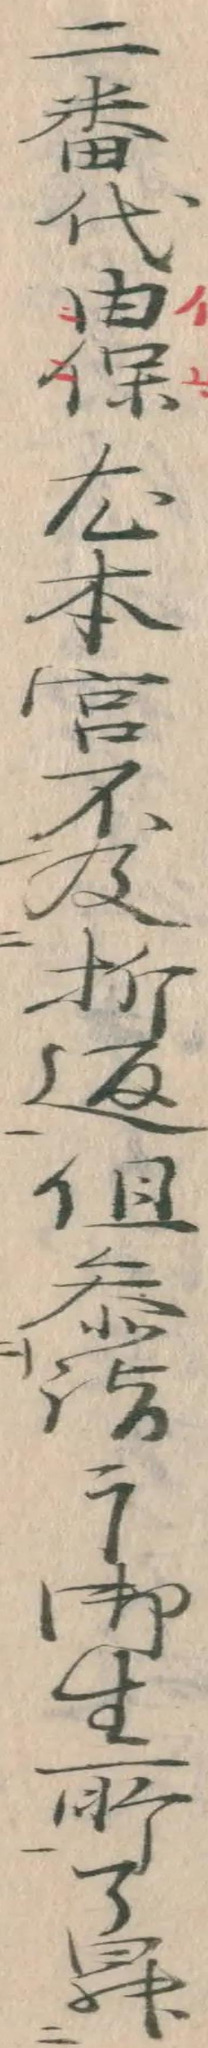二番代由保尤本宮不及折返但参詣于御生所了昇
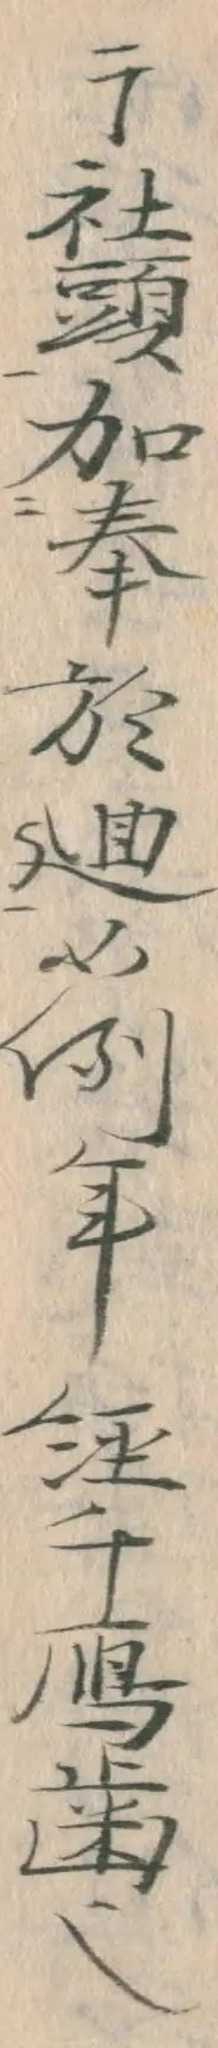之社頭加奉於廻如例年経千鷹歯也
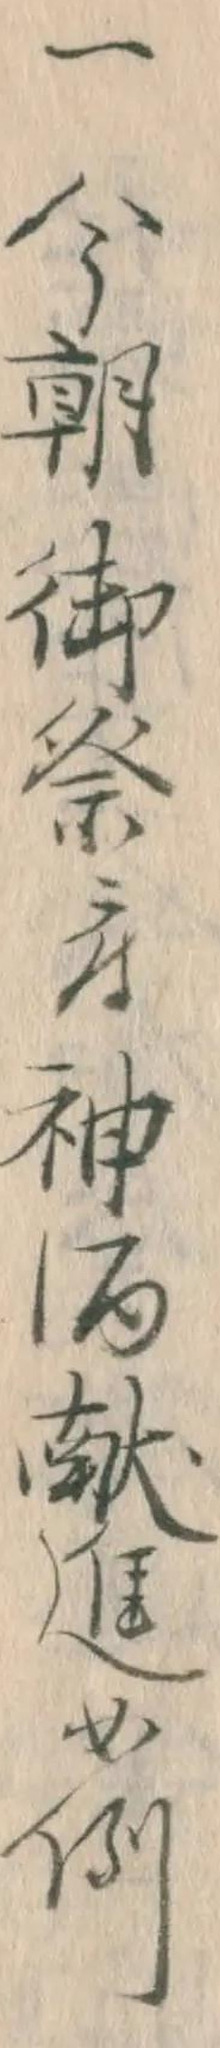一今朝御祭ニ付神酒献進如例
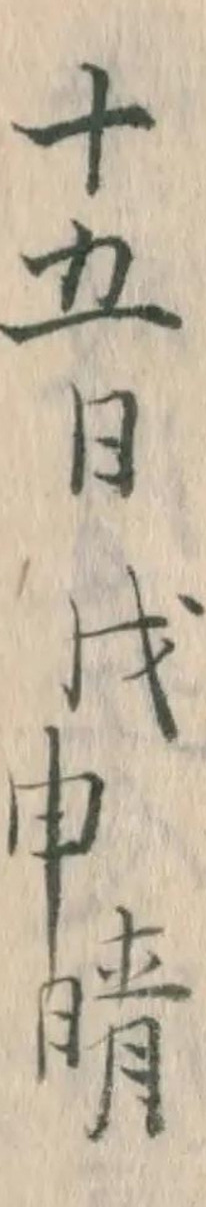十五日戊申晴
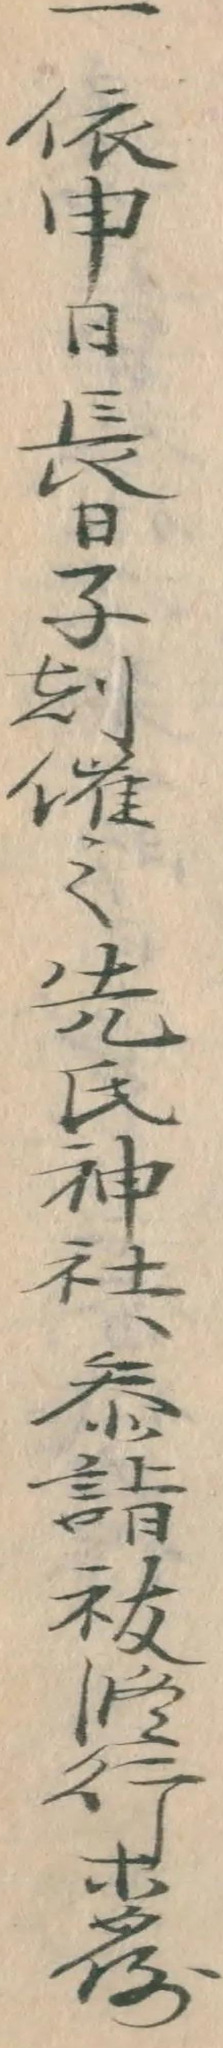一依申日長日子刻催之先氏神社へ参詣祓修行等如例

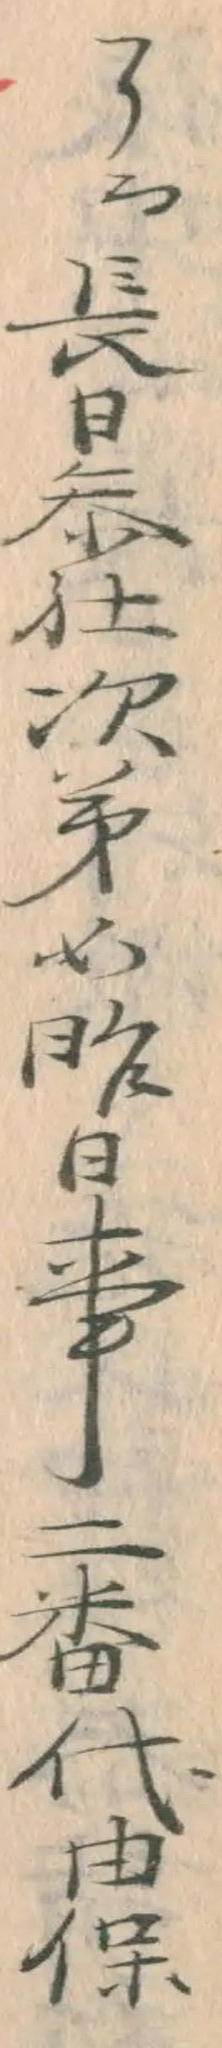了而長日参社次第如昨日事二番代由保
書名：賀茂社記録. 第73冊
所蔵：国立国会図書館 National Diet Library, JAPAN
